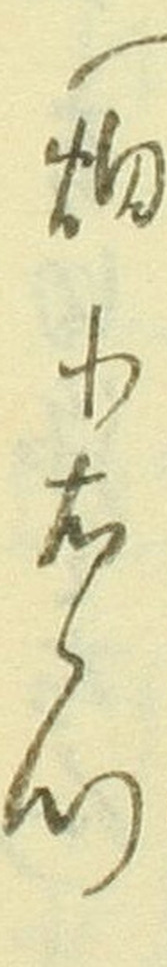畑小右衛門
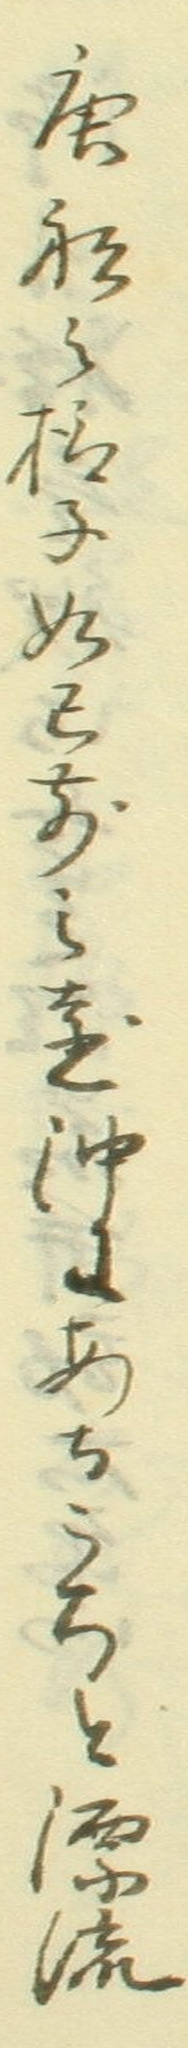唐船之様子如己前之遠沖にあちこちと漂流
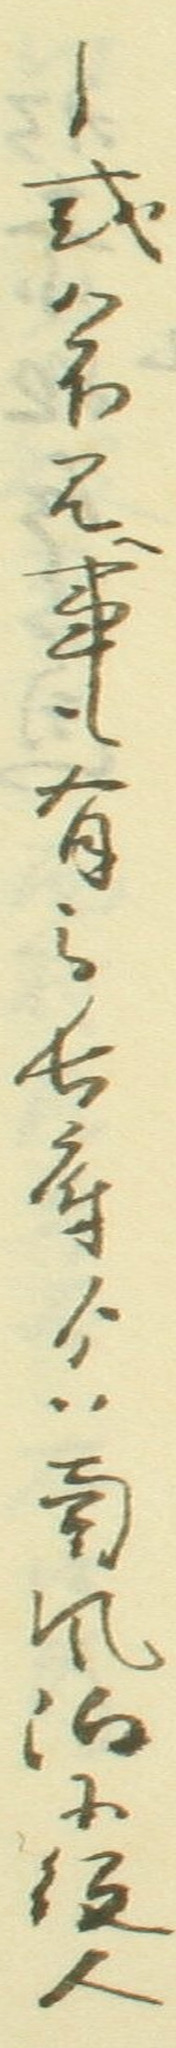し或は不見へ事も有之長府ゟ南風泊に役人
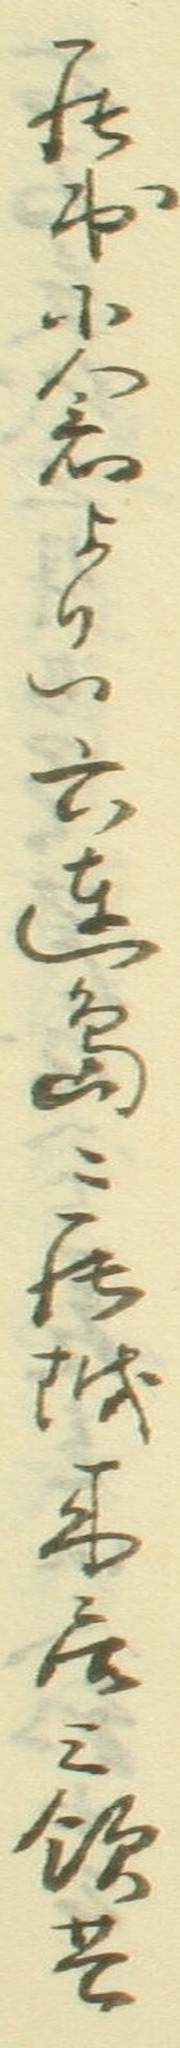罷出小倉よりは六連島に罷越来居三飲共
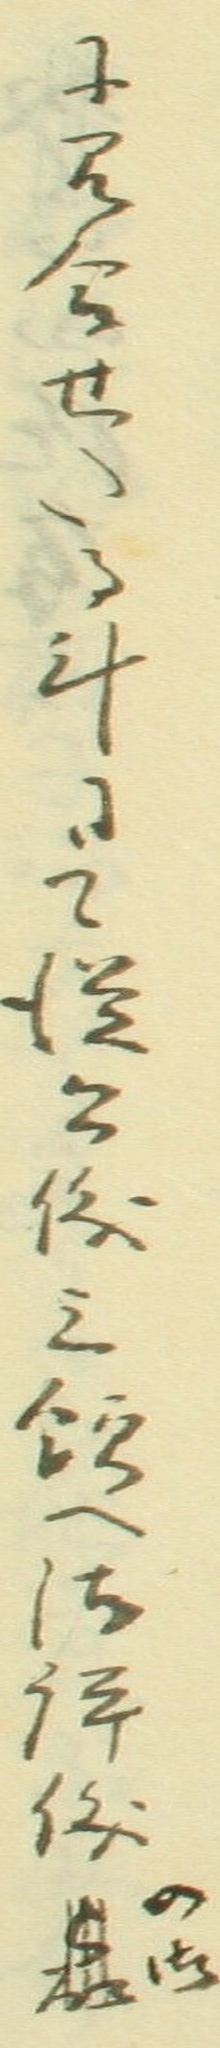に見合せたる斗にて従公儀三飲へ御評儀？？の御

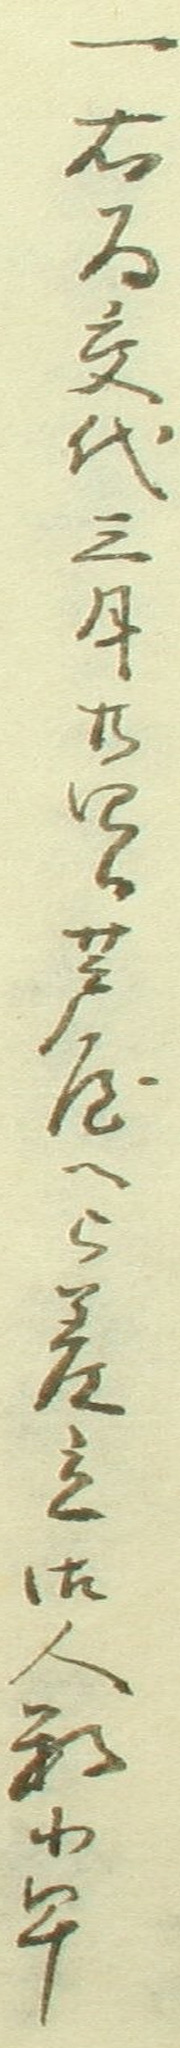一右為交代三月廿四日芦屋へ被差立御人数小早
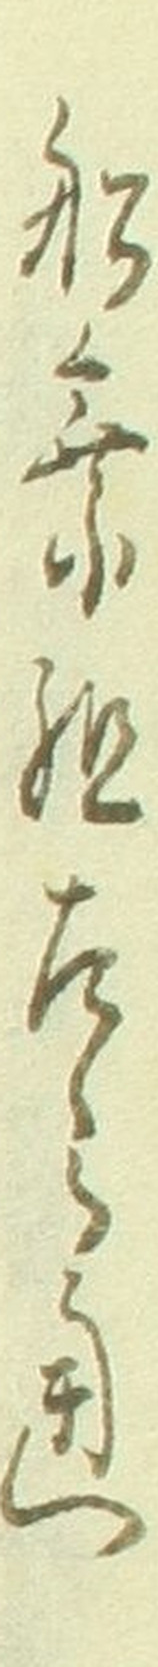船乗組左之通
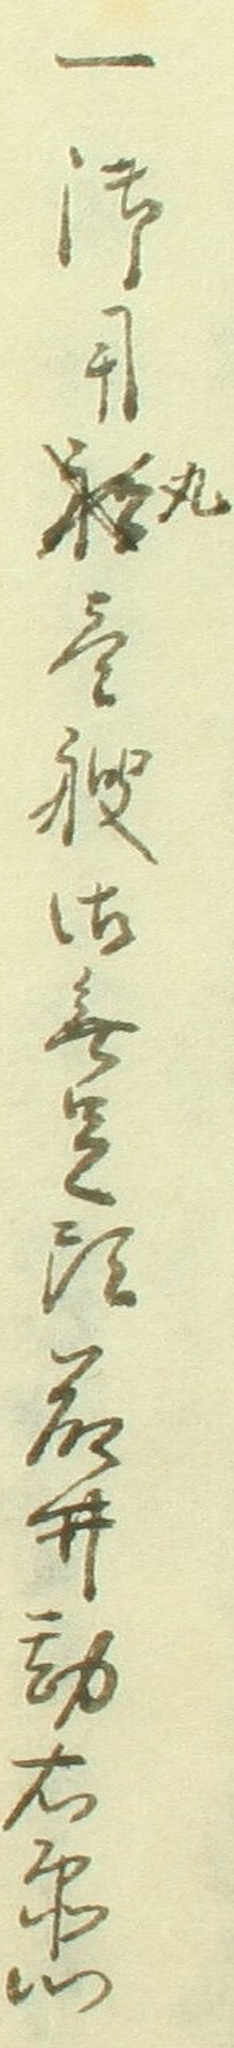一御用船丸壱艘御無足頭藤井勘右衛門
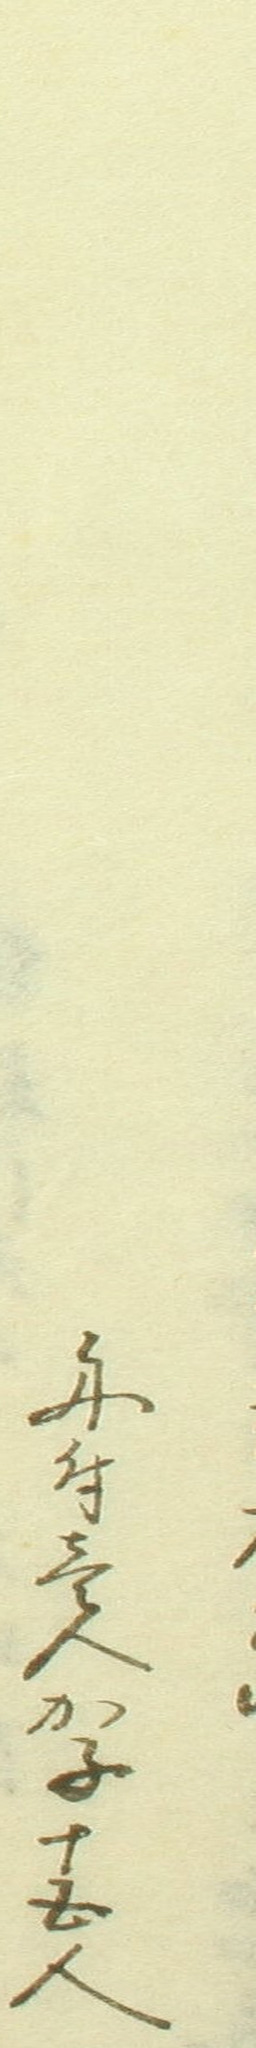舟付壱人加子十五人
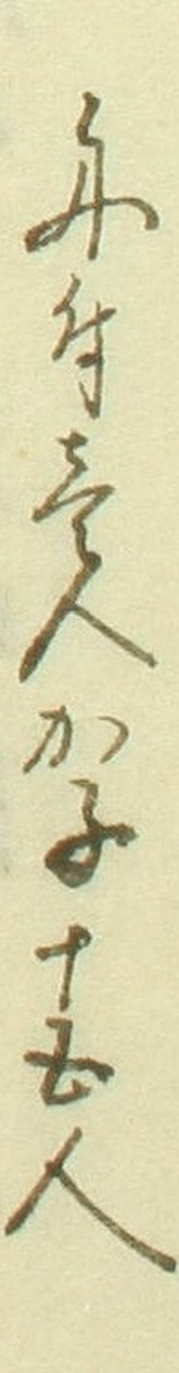舟付壱人加子十五人
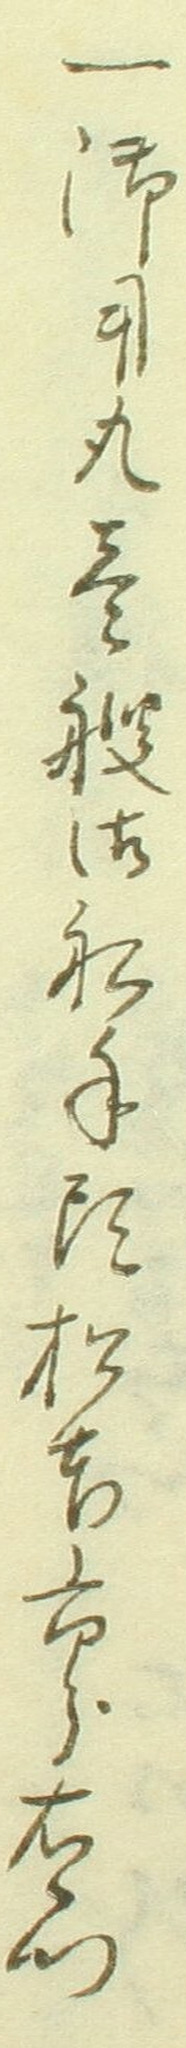一御用丸壱艘御船手頭松本市郎右衛門
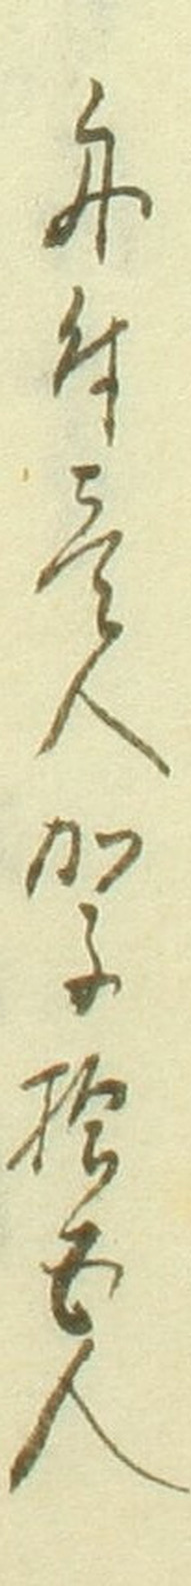舟付壱人加子十五人
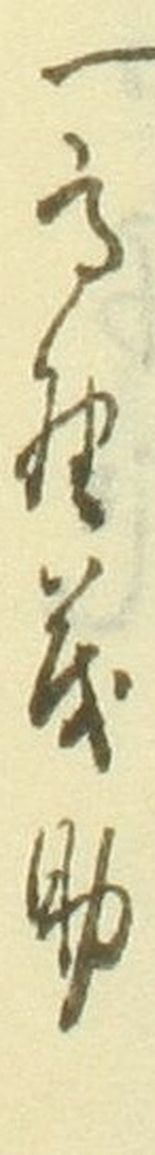高野茂助
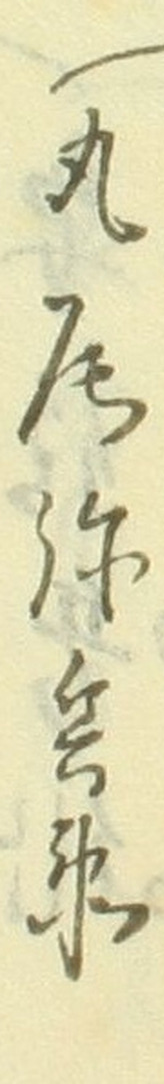丸尾弥兵衛
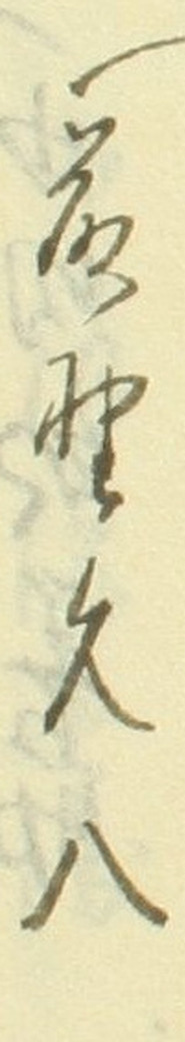藤野久八
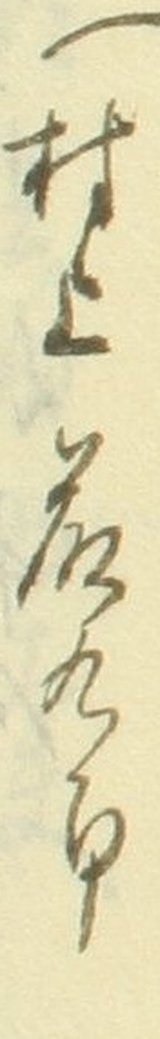村上籐九郎
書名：唐船漂流記 四
